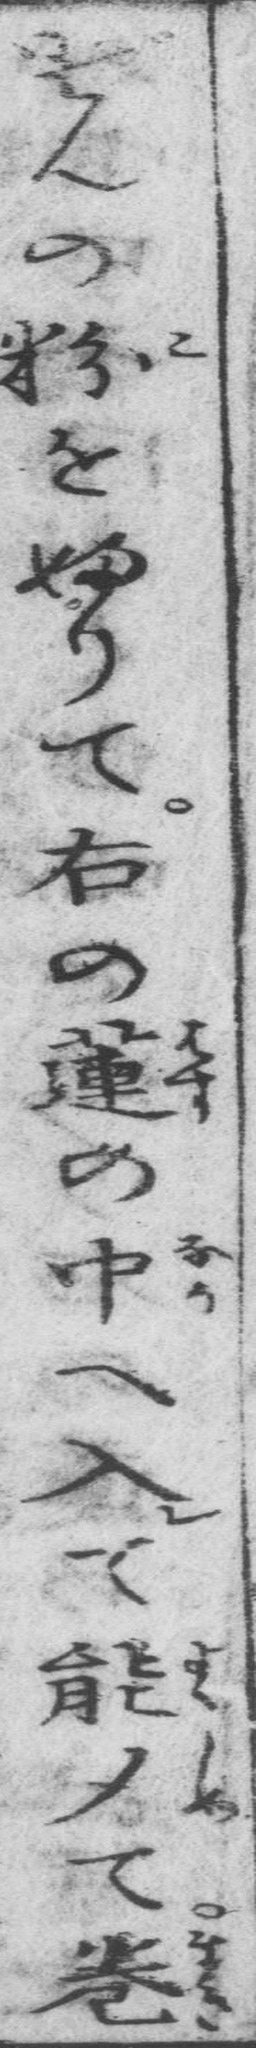どんの粉をふりて。右の蓮の中へ入れて。能〆て。巻

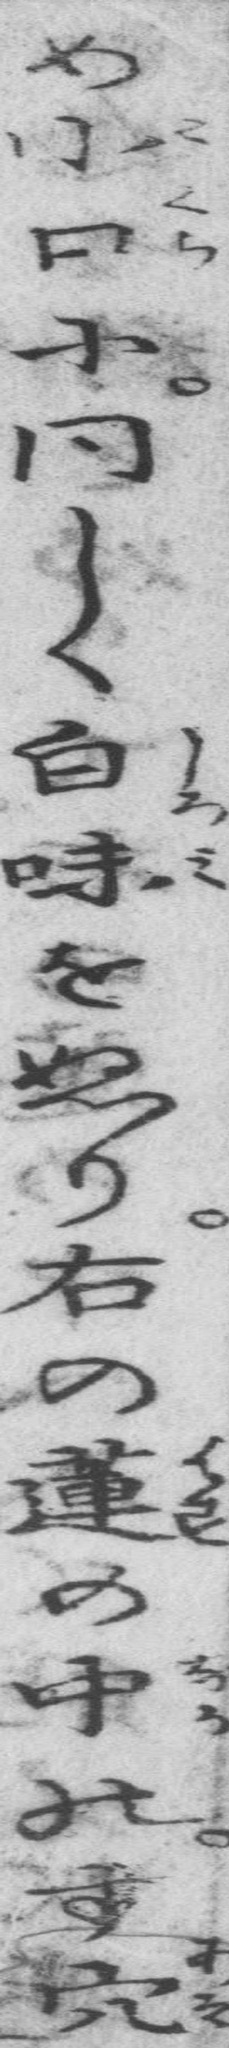め小口に。同しく白味をぬり。右の蓮の中の。す穴
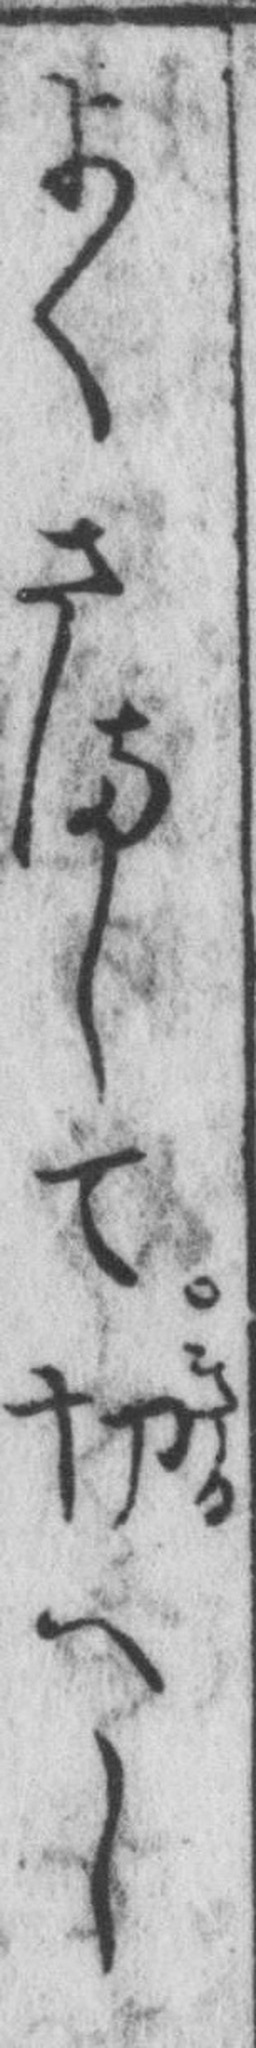よくさまして。切へし
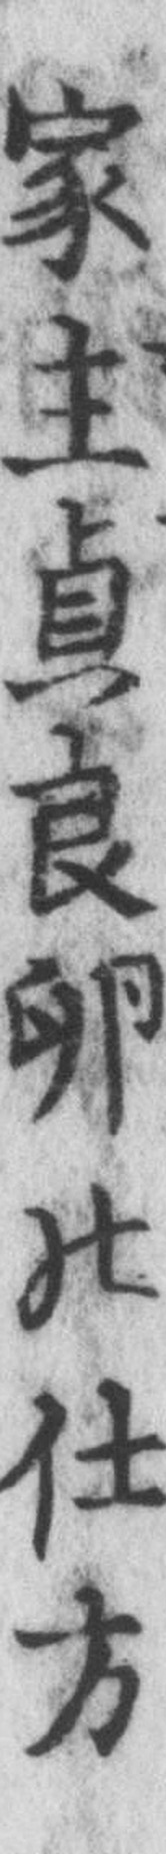家主貞良卵の仕方
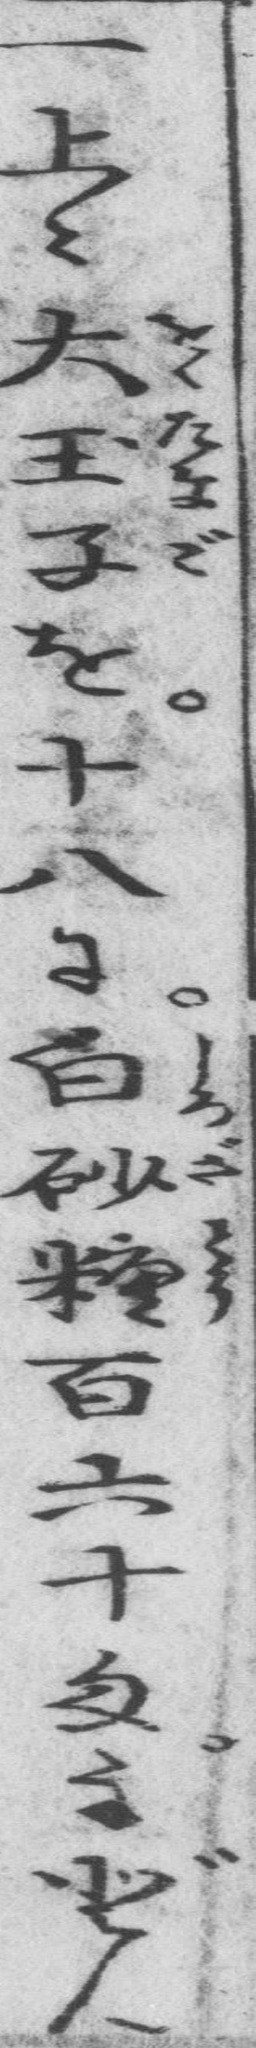一上々大玉子を。十八に。白砂糖百六十匁。うどん
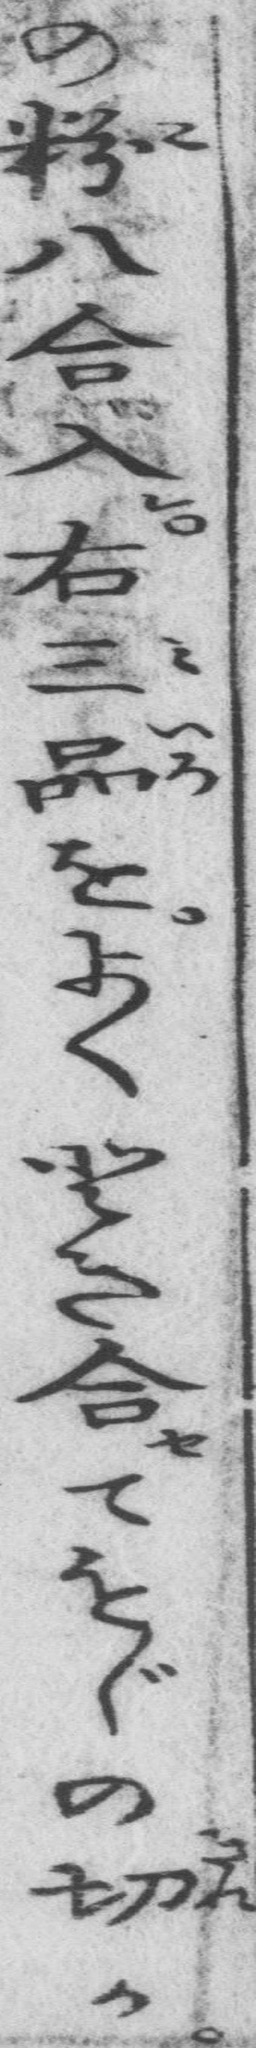の粉八合入れ。右三色を。よくとき合せてもじの切か。
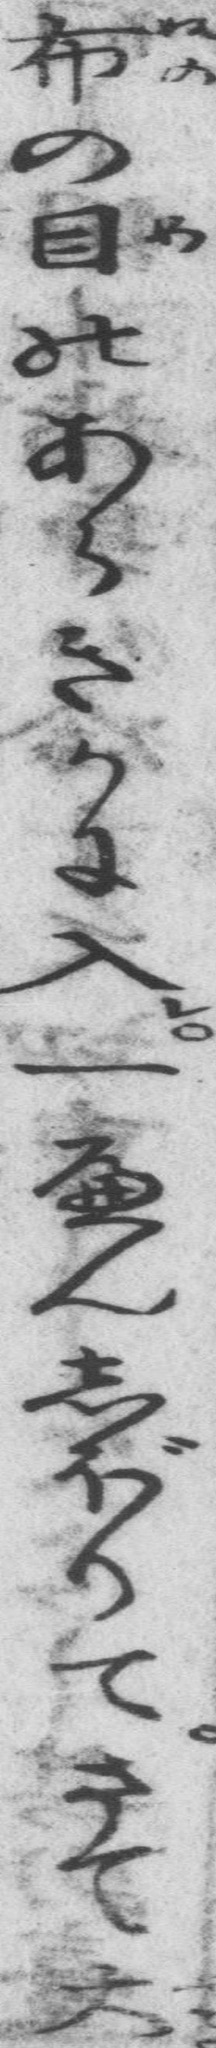布の目のあらきかに入れ。一へんしぼりて。さて大
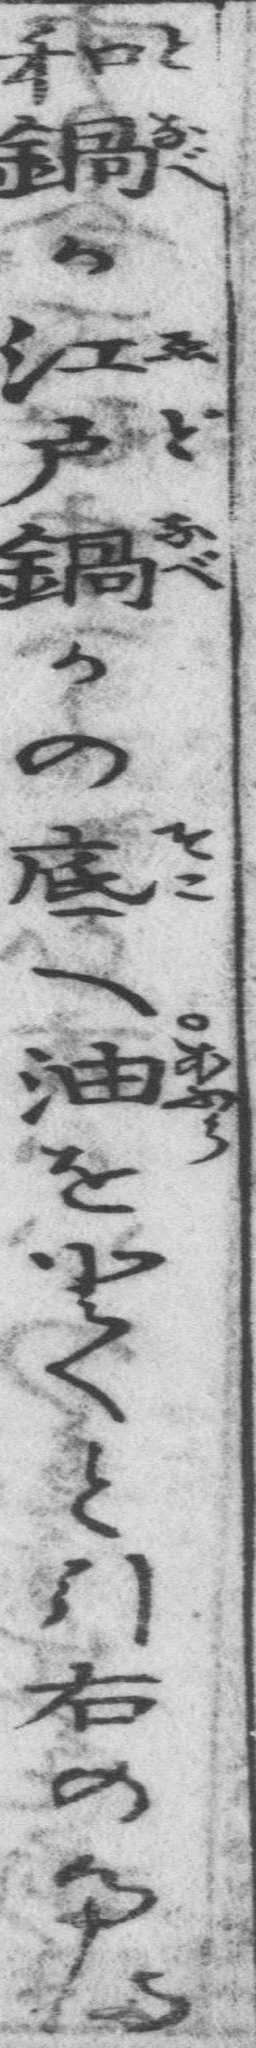和鍋か江戸鍋かの底へ。油をとくと引右のたま
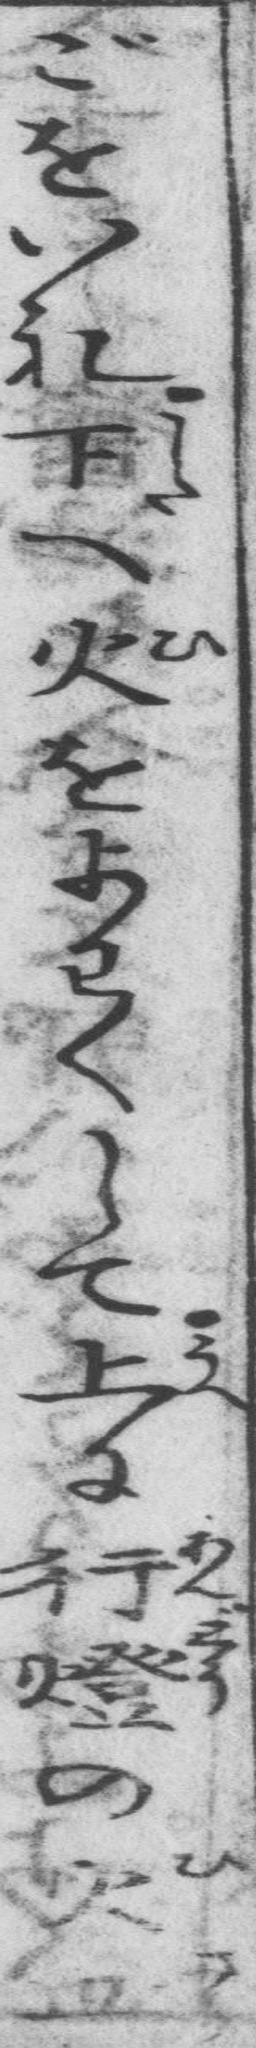ごをいれ。下へ火をよわくして。上に行灯の火皿
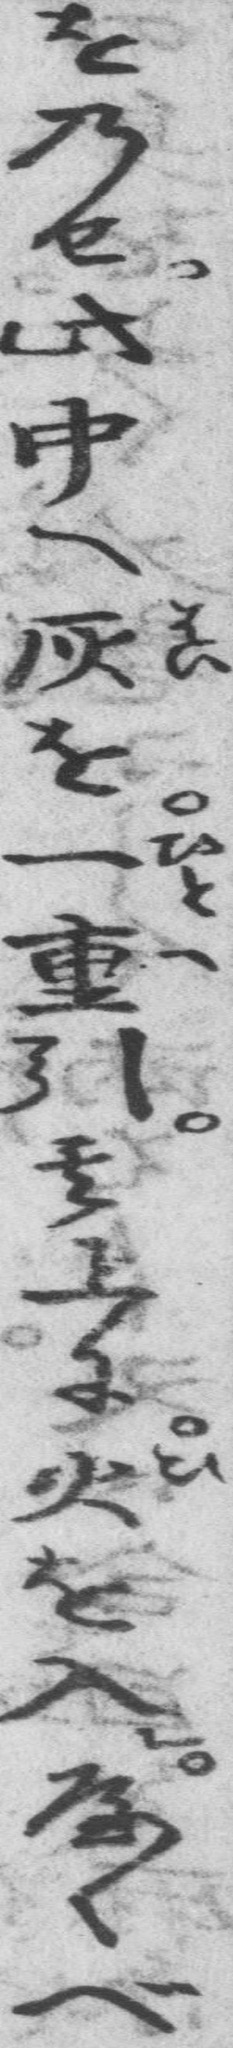をのせ。此中へ灰を。一重引。其上に。火を入れ。やくべ
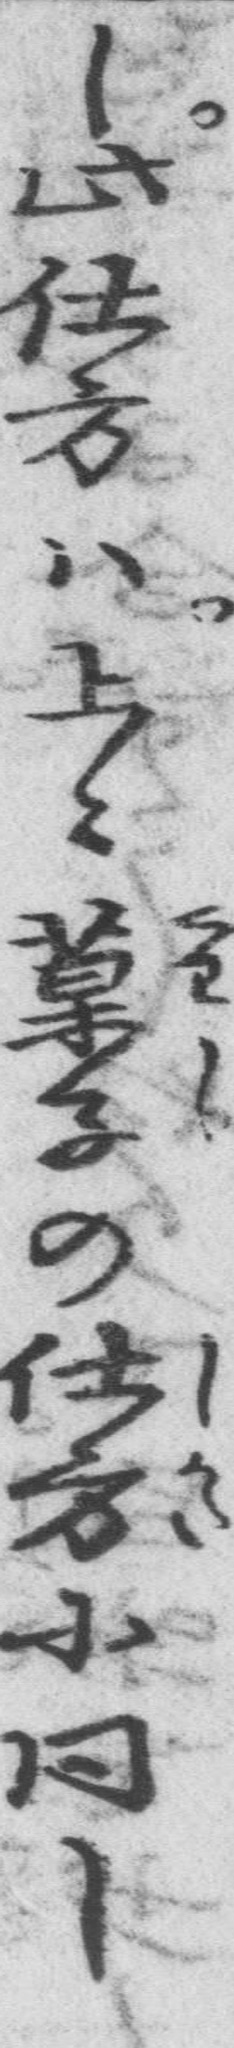し。此仕方は。上々菓子の仕方に同し
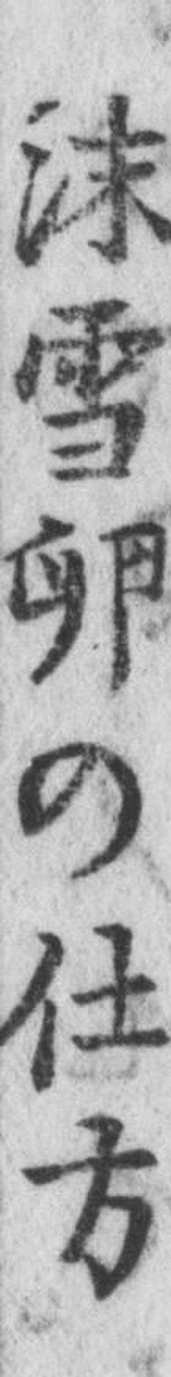沫雪卵の仕方
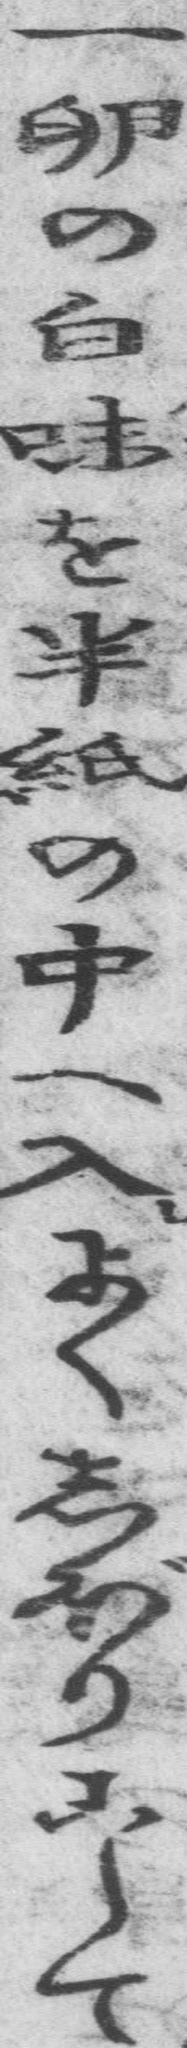一卵の白味を。半紙の中へ入れよくしぼりこして。
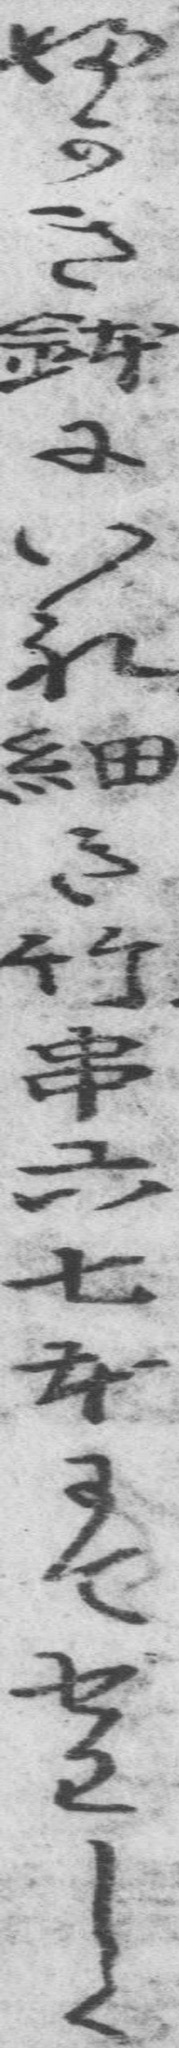ふかき鉢にいれ。細き竹串。六七本にてせわしく
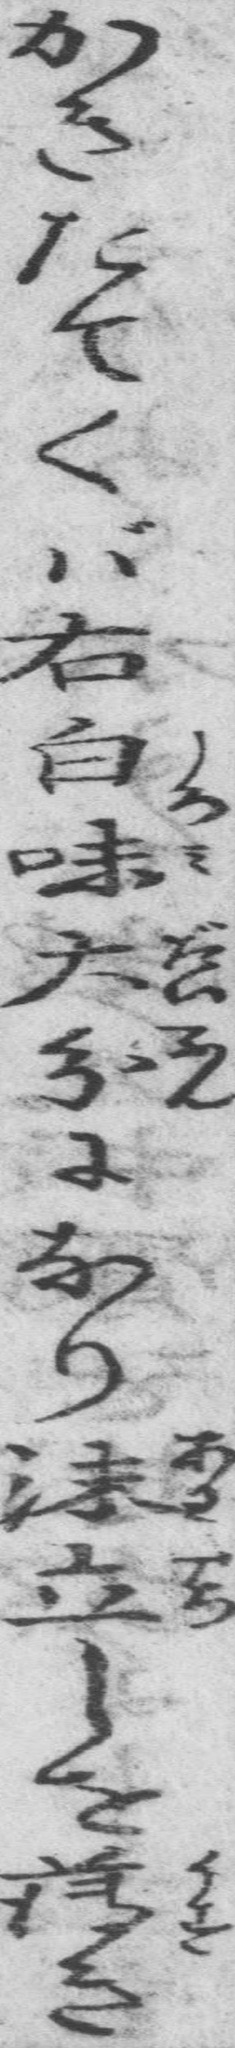かきたて〳〵ば右白味大分になり沫立しを薄き
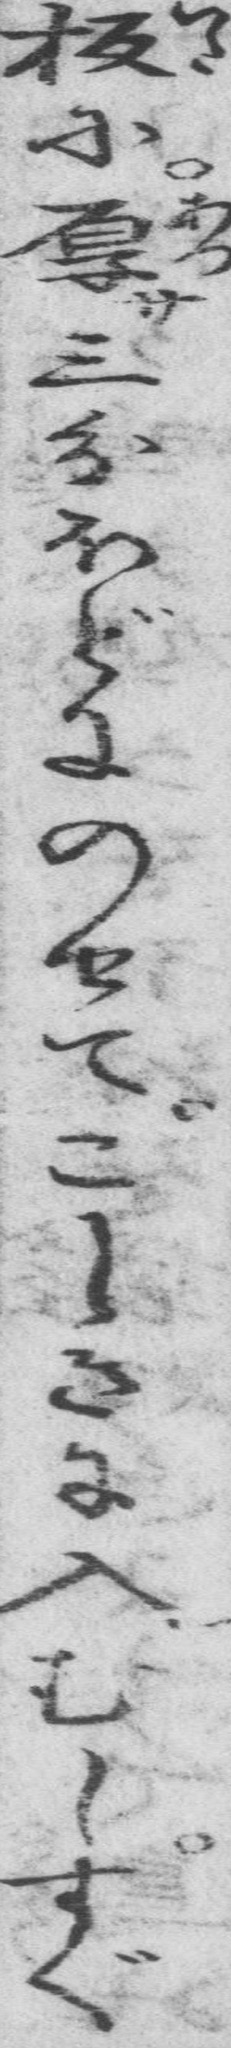板に。厚さ三分ほどにのせて。こしきに入れ。むし。すぐ
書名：萬寳料理秘密箱
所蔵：大阪府立大学学術情報センター 国文学研究資料館
